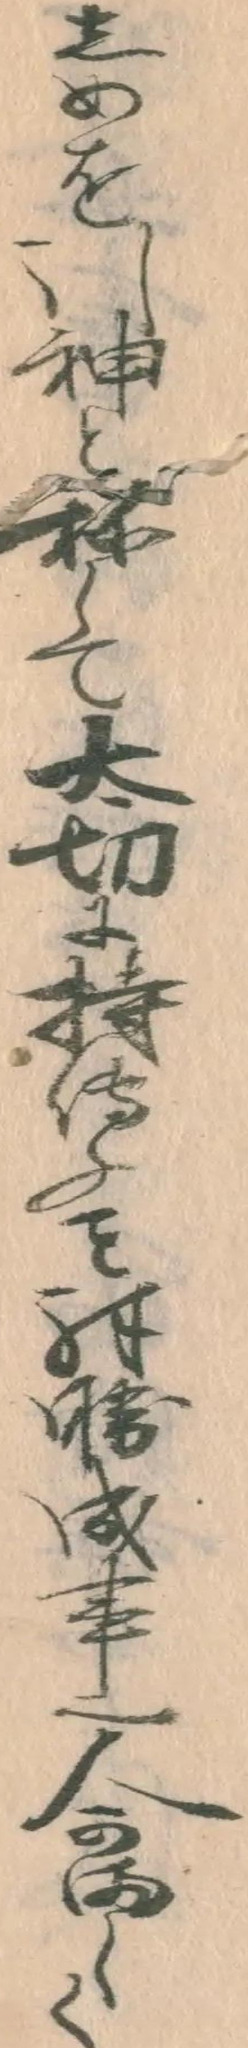しめを引神と称して大切に持伝ふこと殊勝成事也人かましく
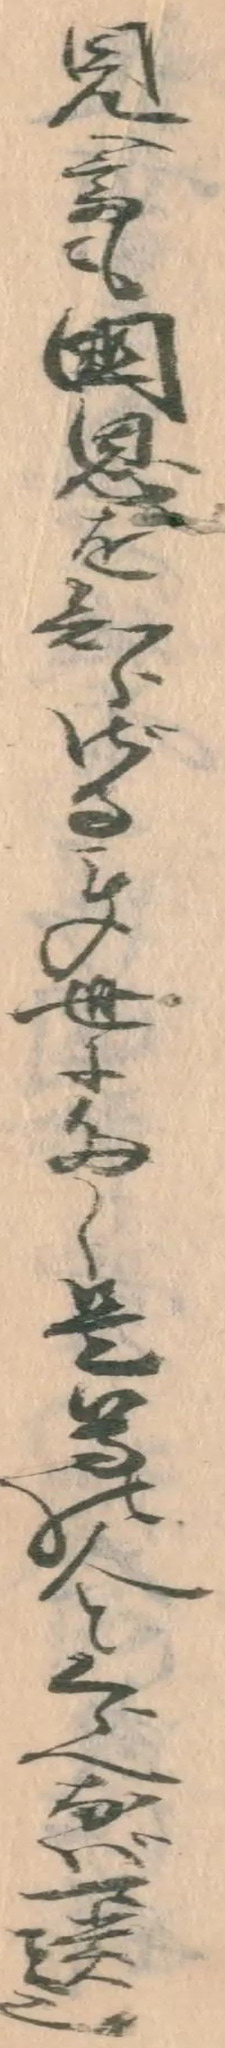見ても国恩を知らざるもの世に多し是等の人とくらへなば可賞こと也
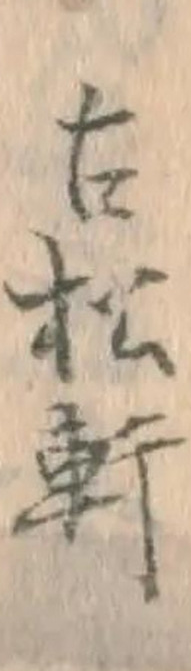古松軒
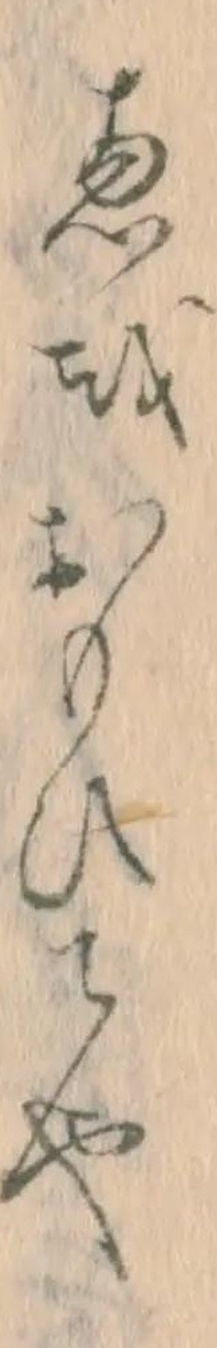恵をおもひてや
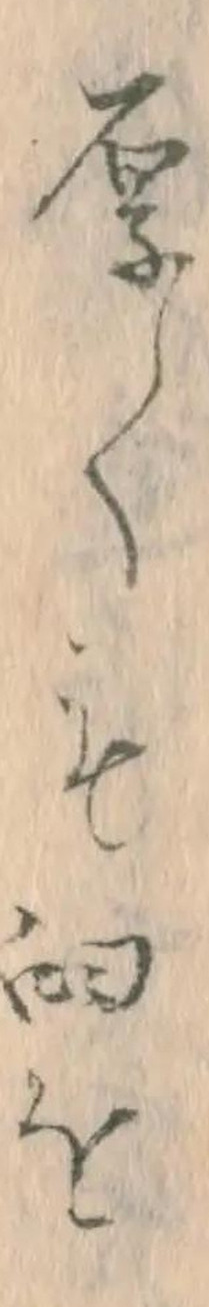厚くも臼を

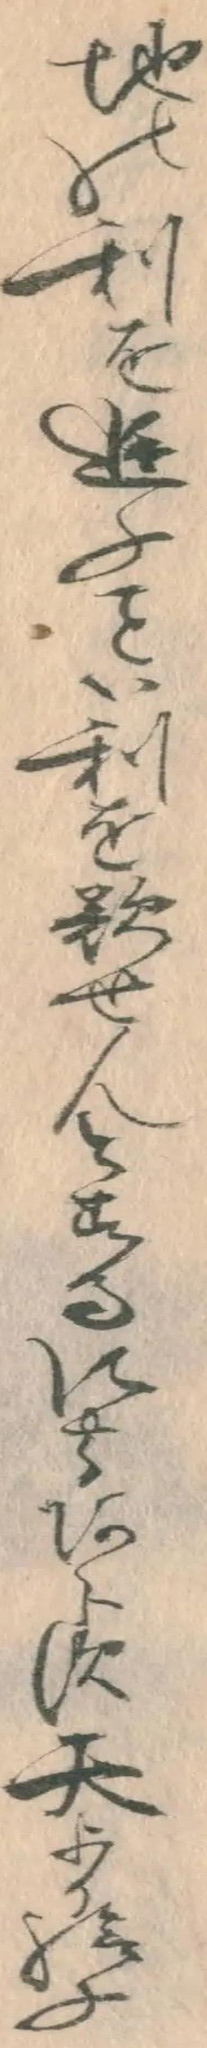地の利を追ふことは利を欲せんとするにはあらす天より給ふ
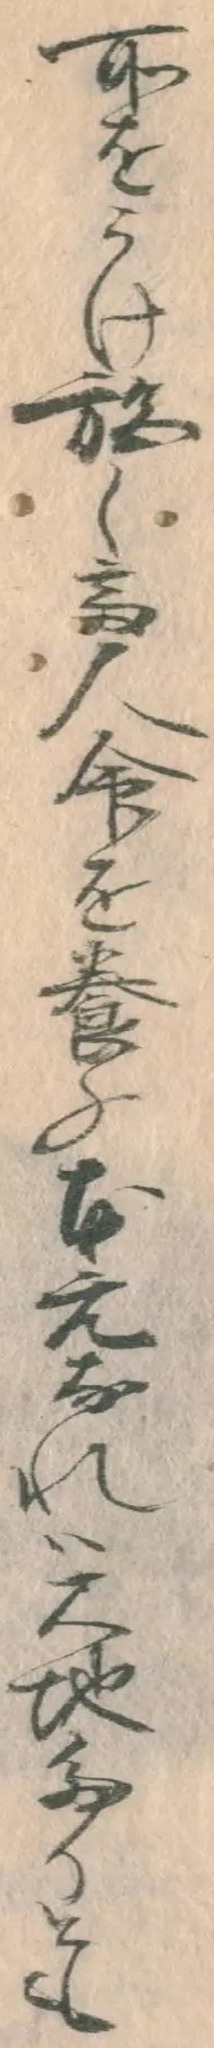所をうけ施して人命を養ふ本元なれは大地たりとも
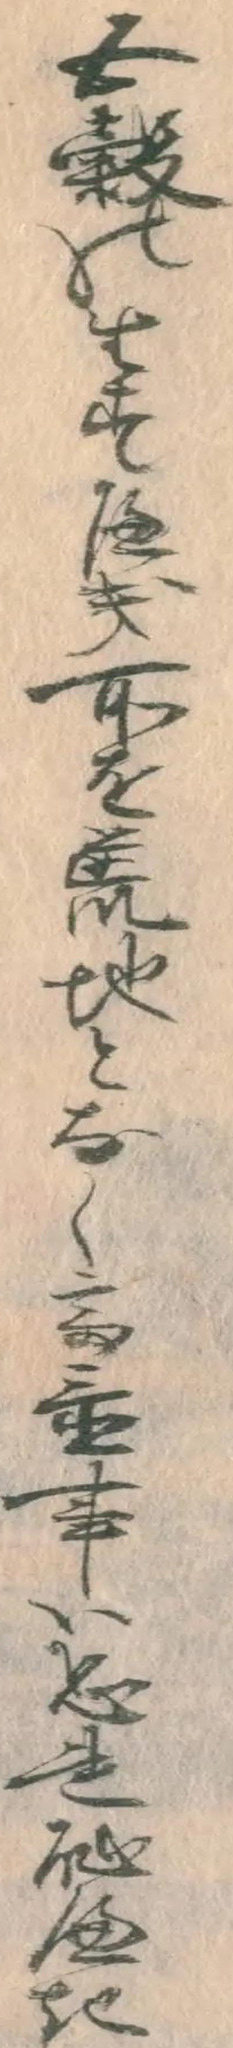五穀の生すへき所を荒地となして置事は恐れ恥へき
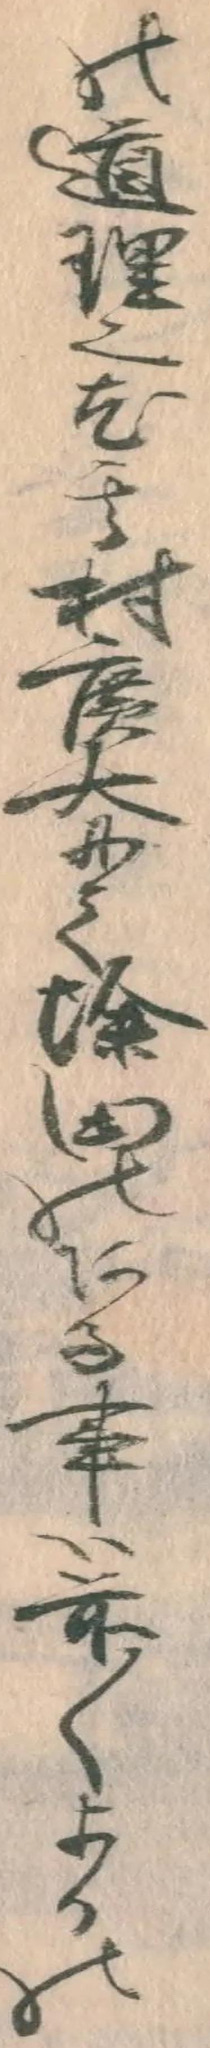の道理也尤高村広大にて除田のある事は前〳〵よりの
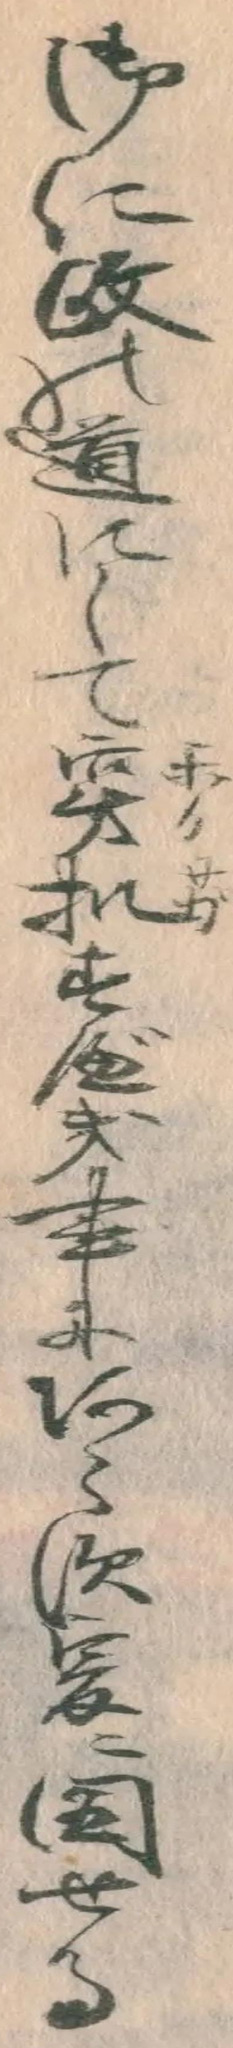御仁政の道にして穿扖すべき事にあらす爰に図せる
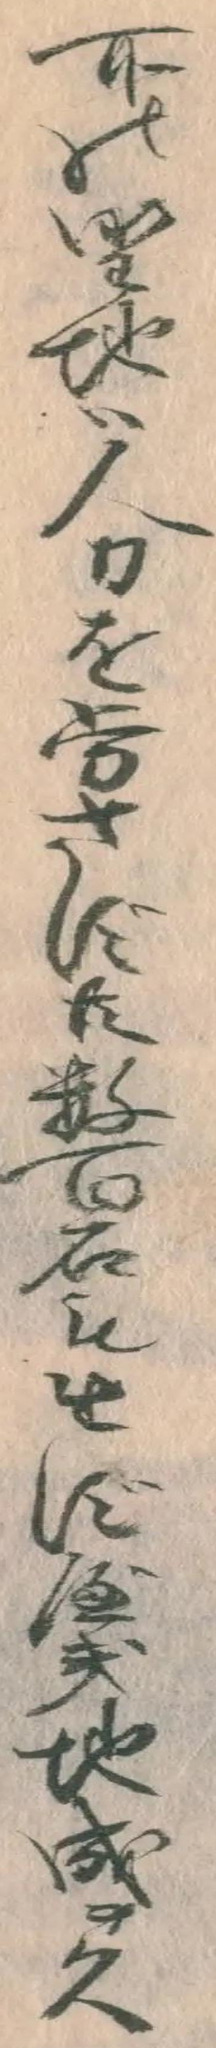所の野地は人力を労さず共数百石も出ずべき地成を久
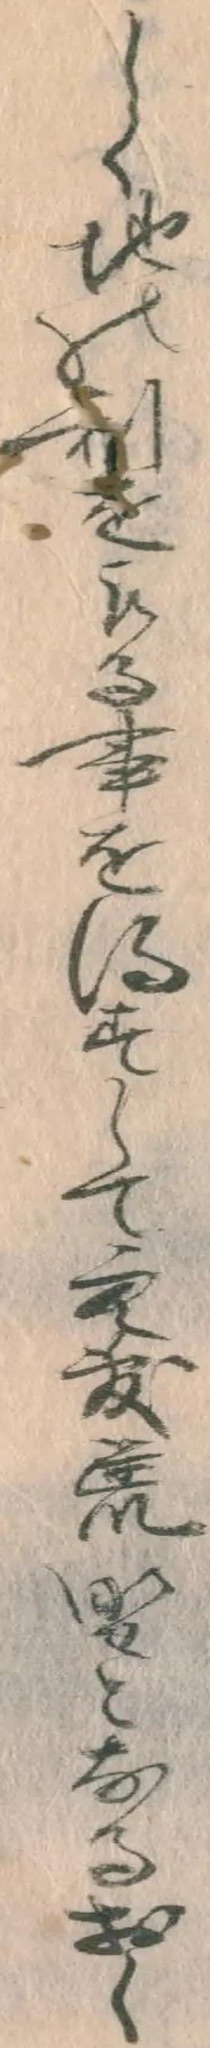しく地の刻を取る事を得すして空敷荒野となるおし
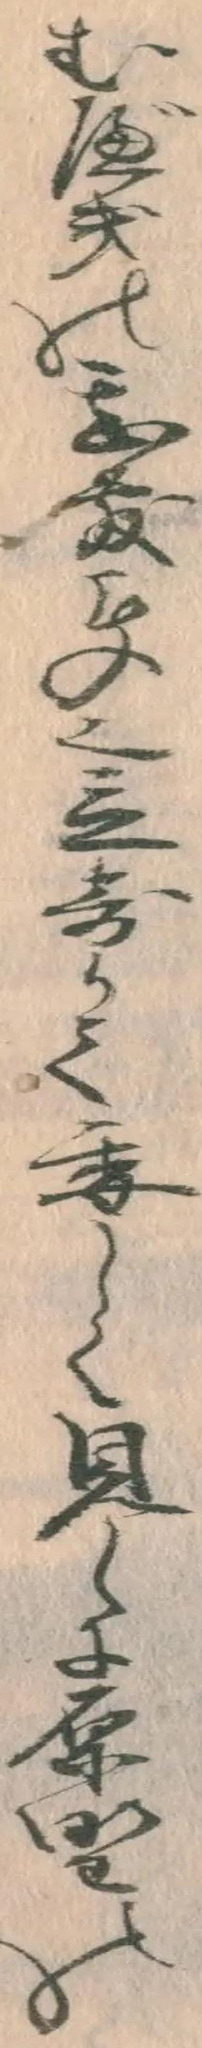むべきの甚敷もの也立寄りて委しく見しに原野の
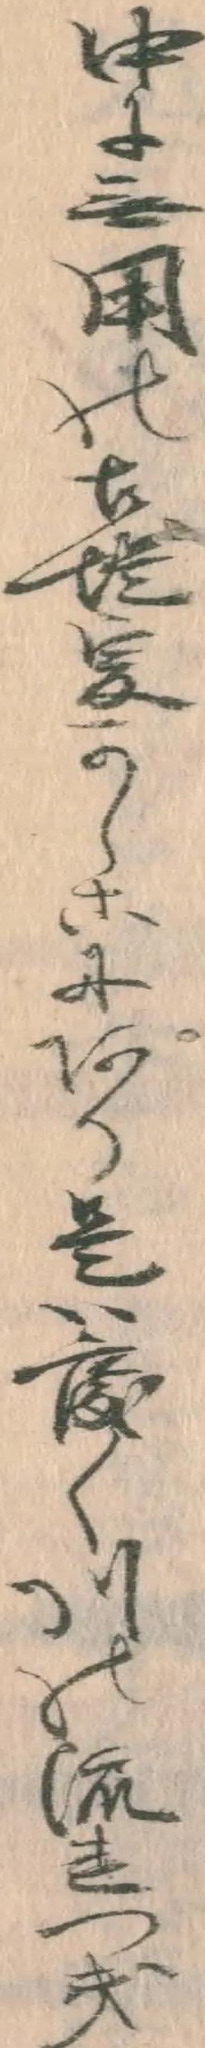中に無用の古堤爰かしこにあり是は広く川の流れつき
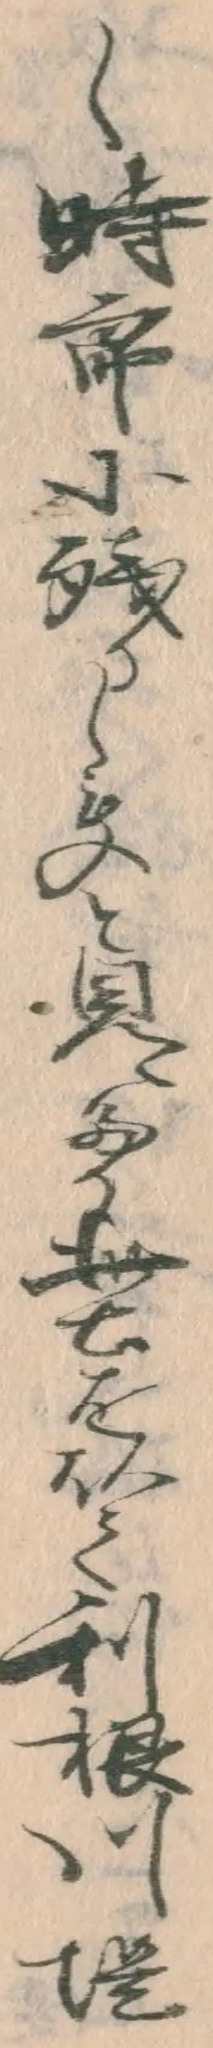し時節に残りしものと見へたり此土を以て利根川堤
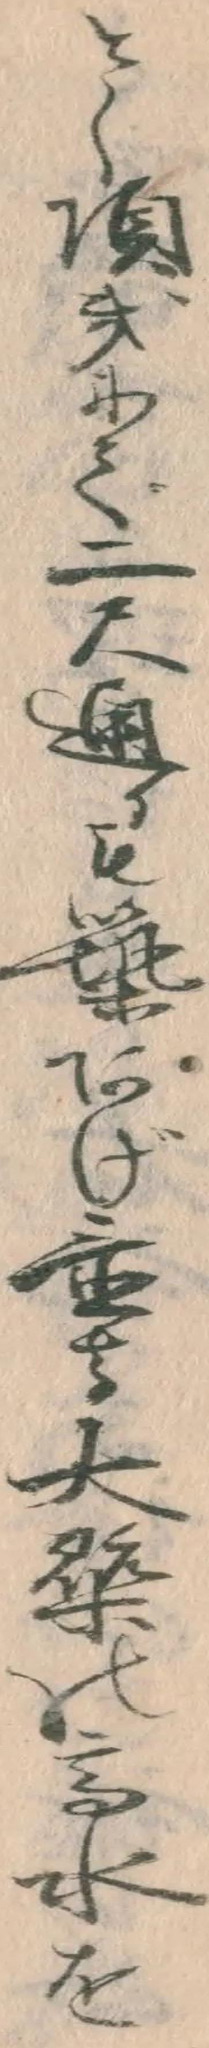とし頂きにて二尺通りも築あげ置は大概の高水を
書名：四神地名録 6巻. [4]葛飾郡
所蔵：国立国会図書館 National Diet Library, JAPAN
